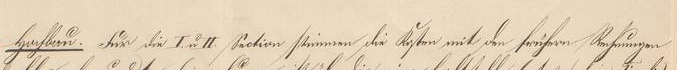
Hochbau. Für die I. u II. Section stimmen die Kosten mit den frühern Rechnungen
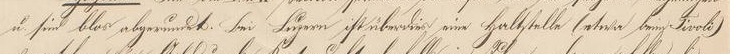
u. sind blos abgerundet. Bei Luzern ist überdies eine Haltstelle (etwa beim Tivoli )
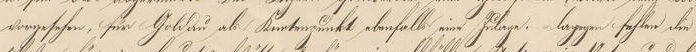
vorgesehen, für Goldau als Knotenpunkt ebenfalls eine Zulage. Dagegen fehlen die
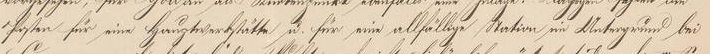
Posten für eine Hauptwerkstätte u. für eine allfällige Station im Untergrund bei
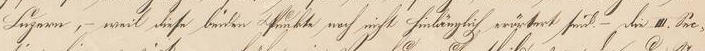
Luzern, – weil diese beiden Punkte noch nicht hinlänglich erörtert sind. – Die III. Sec-
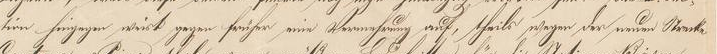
tion hingegen weist gegen früher eine Vermehrung auf, theils wegen der neuen Strecke
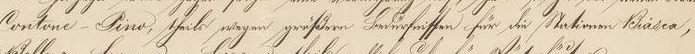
Contone –Pino, theils wegen größern Bedürfnissen für die Stationen Biasca,
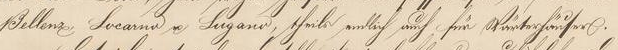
Bellenz, Locarno & Lugano, theils endlich auch für Wärterhäuser.
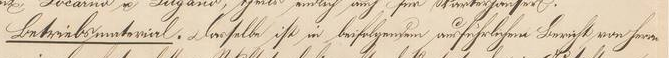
Betriebsmaterial. Dasselbe ist in beifolgendem ausführlichem Bericht von Herrn
